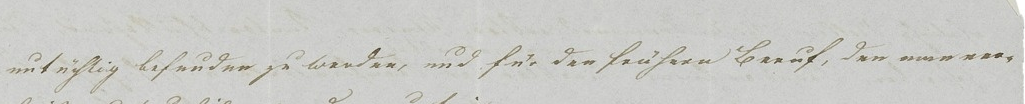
untüchtig befunden zu werden, und für den frühern Beruf, den man ver-
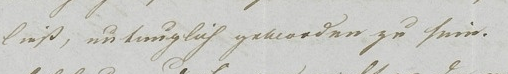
ließ, untauglich geworden zu sein.
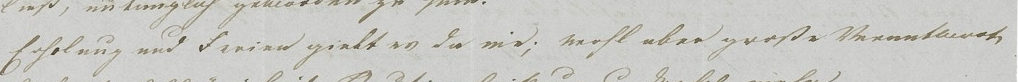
Erholung und Ferien giebt es da nie; wohl aber große Verantwort-
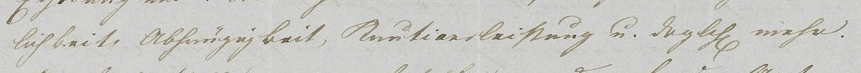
lichkeit, Abhängigkeit, Kautionsleistung u. drglchen mehr.
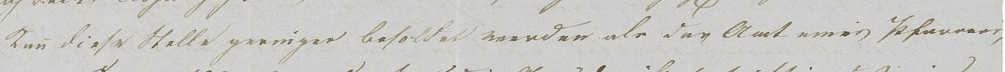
Kann diese Stelle geringer besoldet werden als das Amt eines Pfarrers,
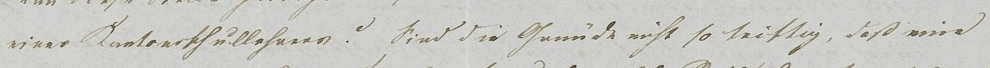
eines Kantonsschullehrers? Sind die Gründe nicht so triftig, daß eine
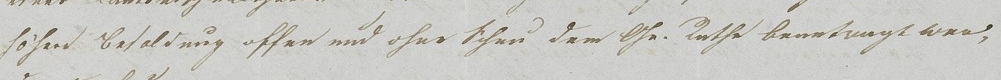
höhere Besoldung offen und ohne Scheu dem Gr. Rathe beantragt wer-
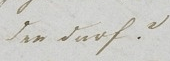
den darf?
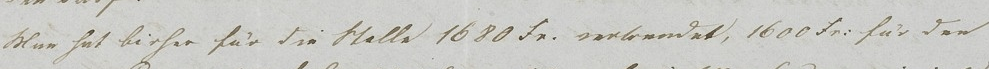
Man hat bisher für die Stelle 1680 Fr. verwendet, 1600 Fr: für den
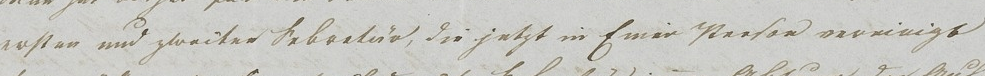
ersten und zweiten Sekretär, die jetzt in Einer Person vereinigt
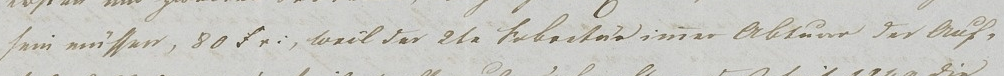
sein müssen, 80 Fr:, weil der 2te Sekretär immer Aktuar der Auf-
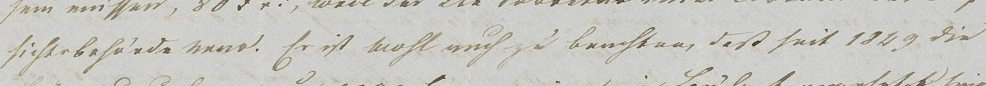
sichtsbehörde war. Es ist wohl auch zu beachten, daß seit 1849 die
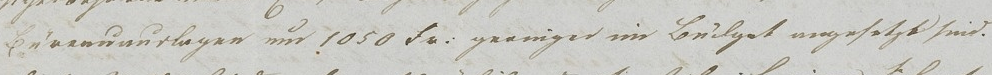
Büreauauslagen um 1050 Fr: geringer im Budget angesetzt sind.
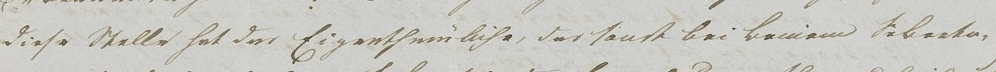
Diese Stelle hat das Eigenthümliche, das sonst bei keinem Sekreta-
